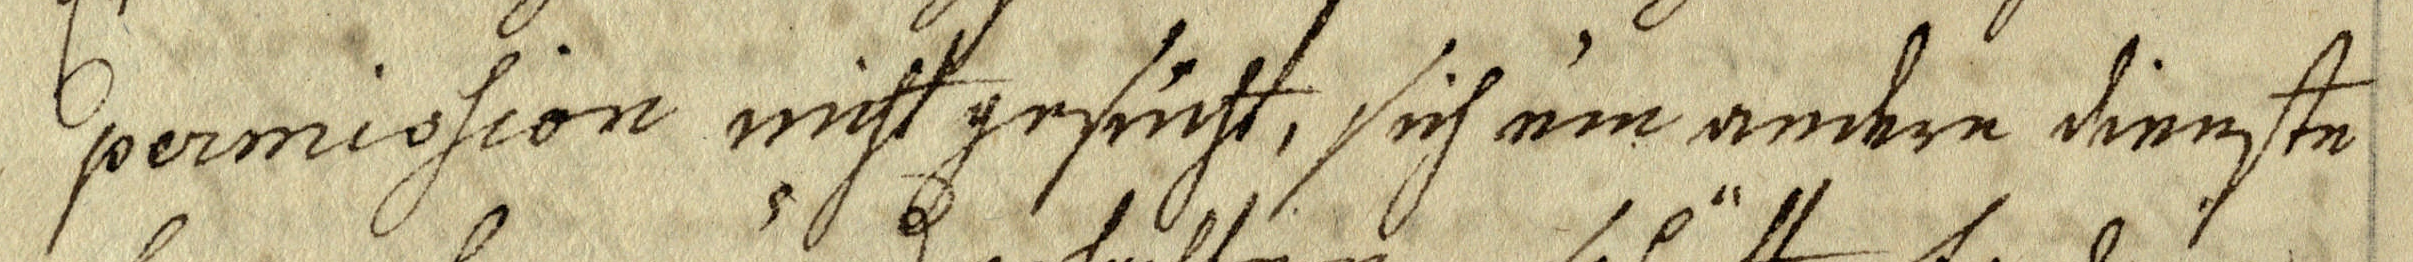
permission nicht ersucht, sich um andere Dienste
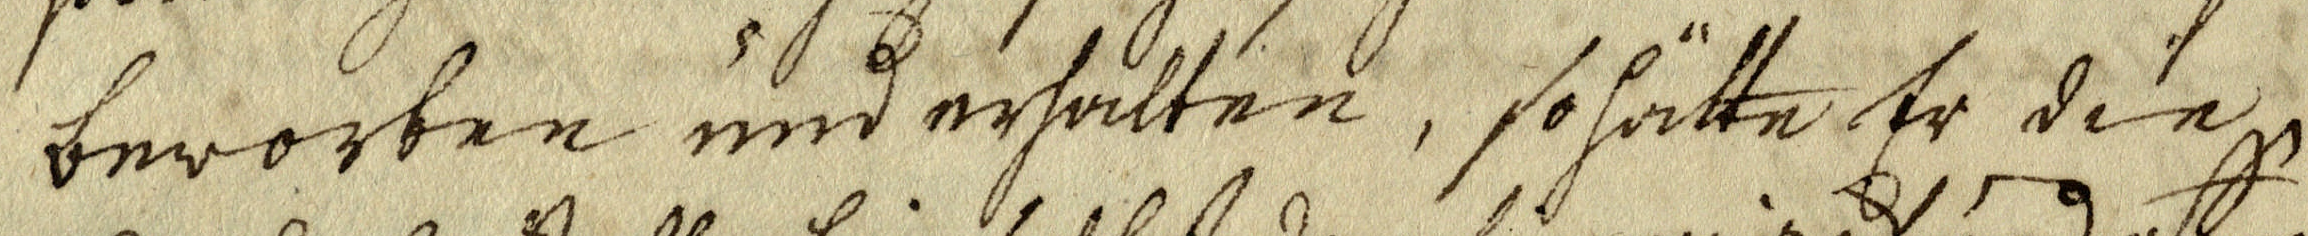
beworben und erhalten, so hätte Er die
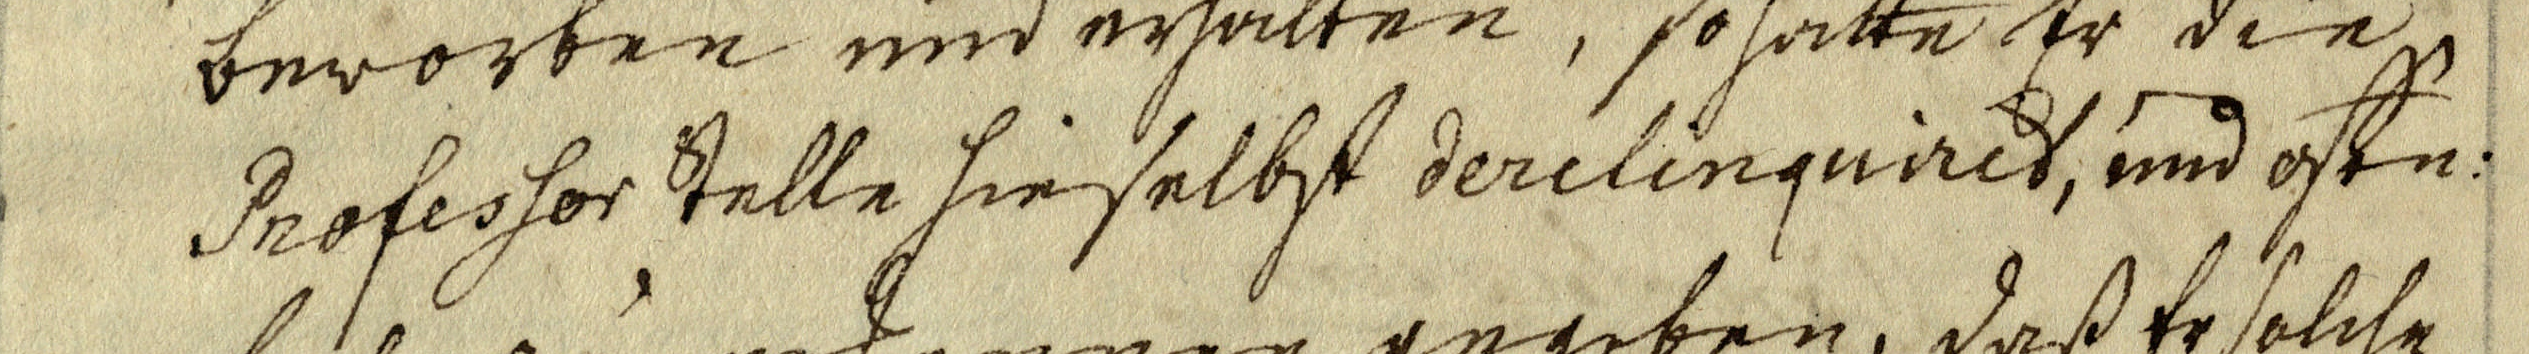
Professor Stelle hieselbst derelinquiret, und offen¬
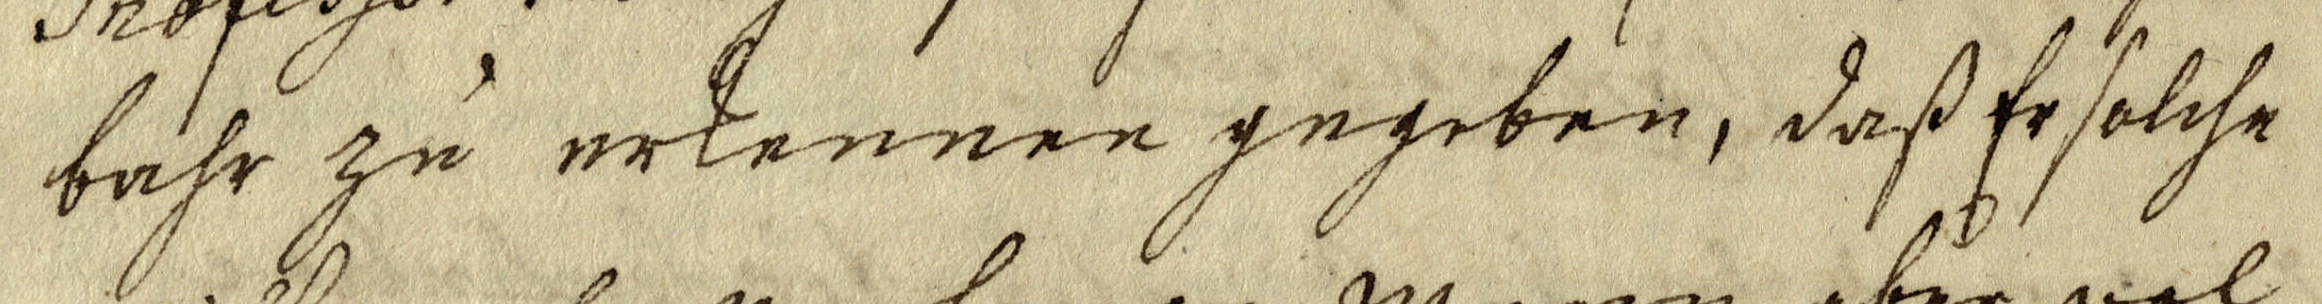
bahr zu erkennen gegeben, daß Er solche
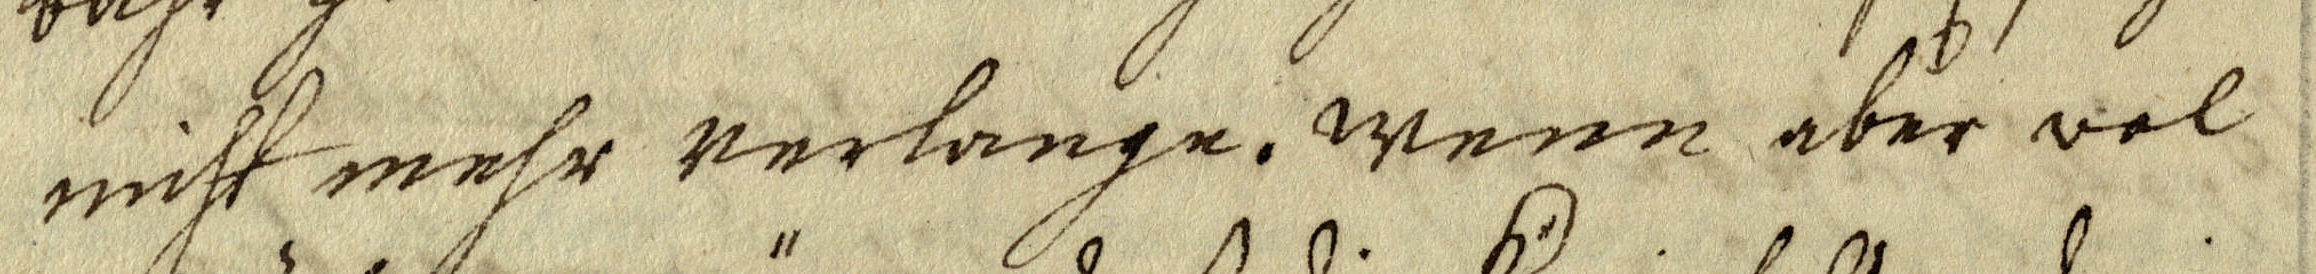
nicht mehr verlange. wenn aber wol
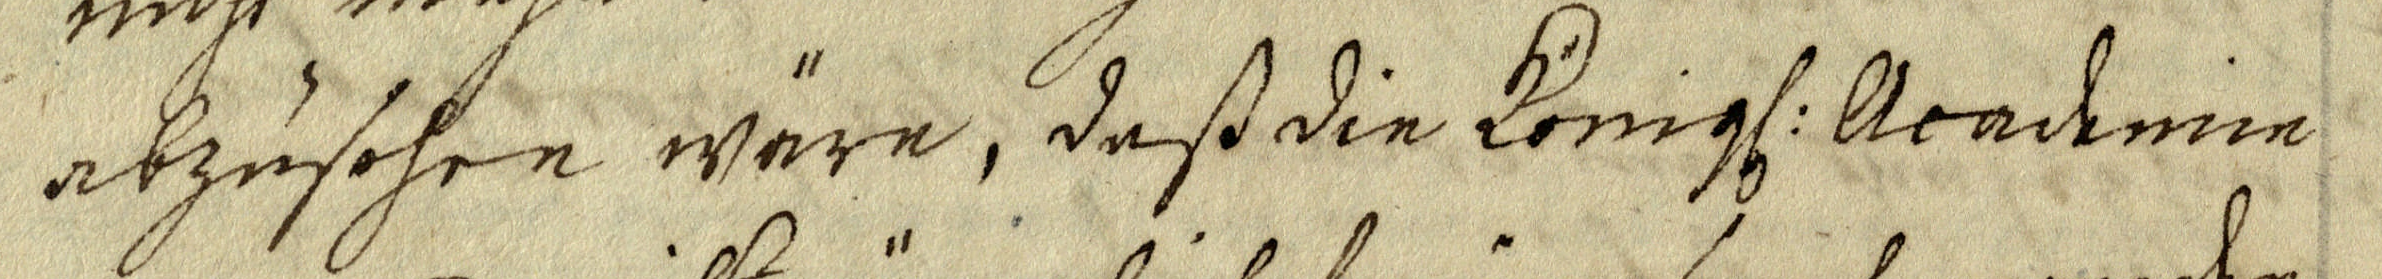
abzusehen wäre, daß die Königl: Academie
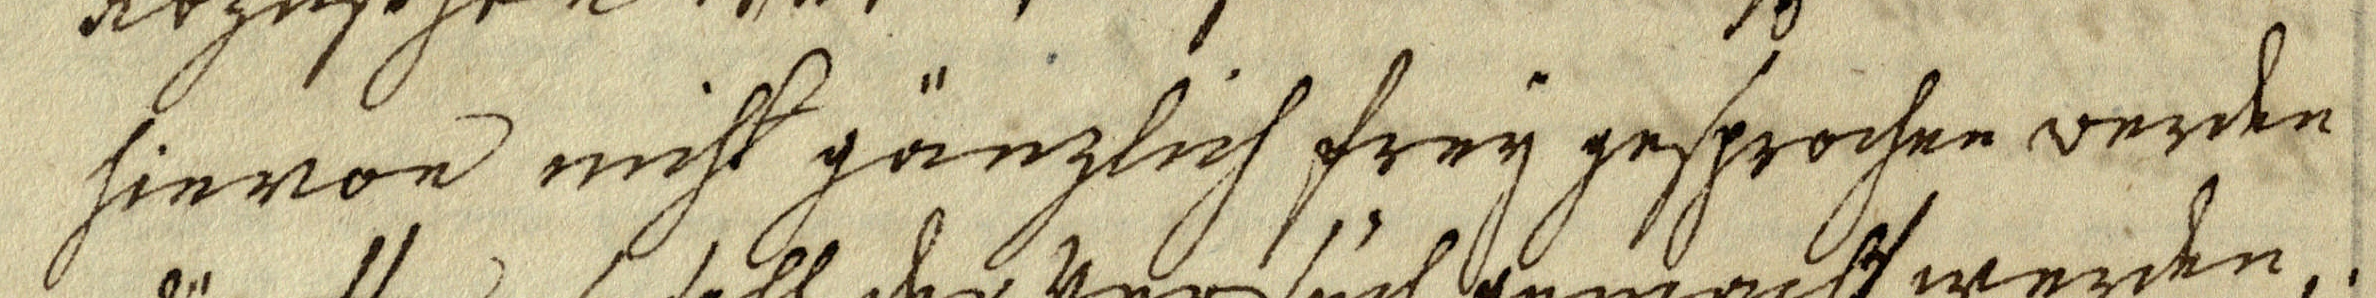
hievon nicht gänzlich freÿ gesprochen werden
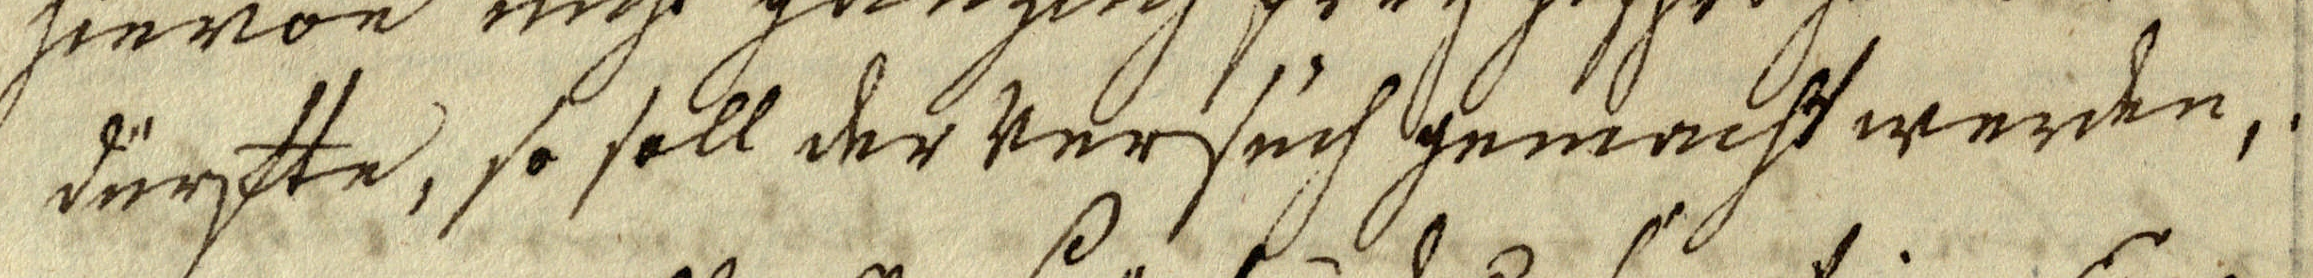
dürfte, so soll der Versuch gemacht werden,
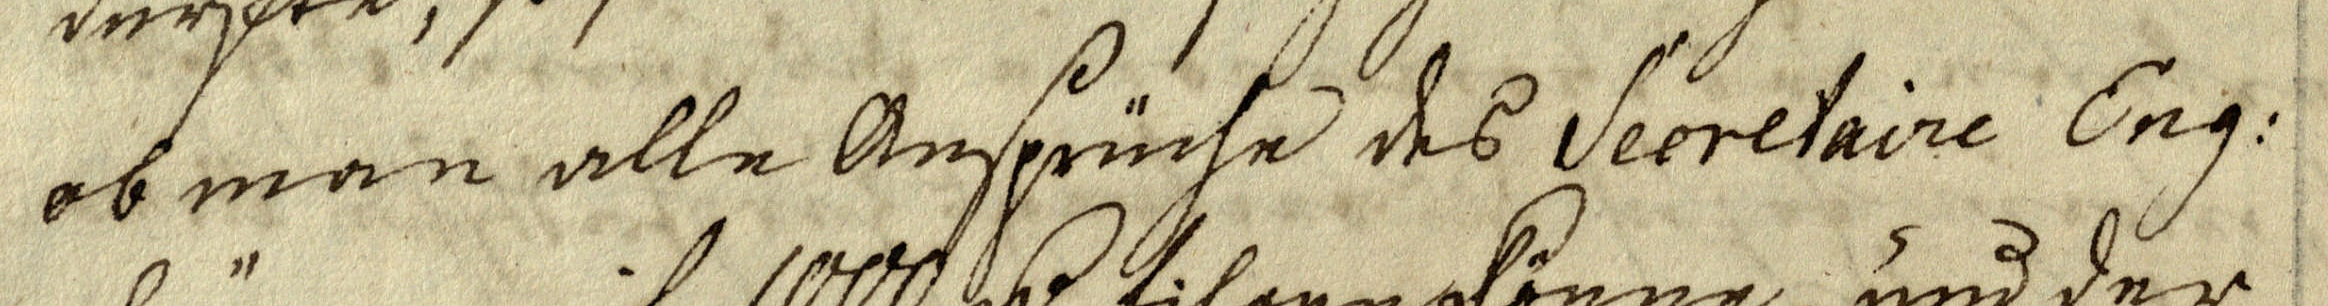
ob man alle Ansprüche des Secretaire Eng¬
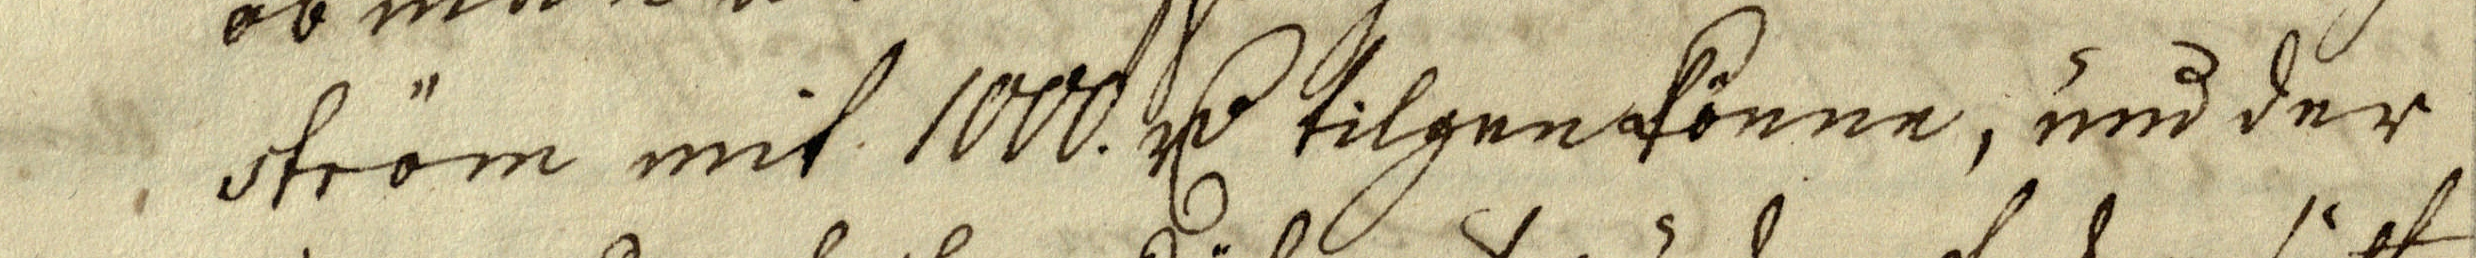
ström mit 1000. r tilgen könne, und der
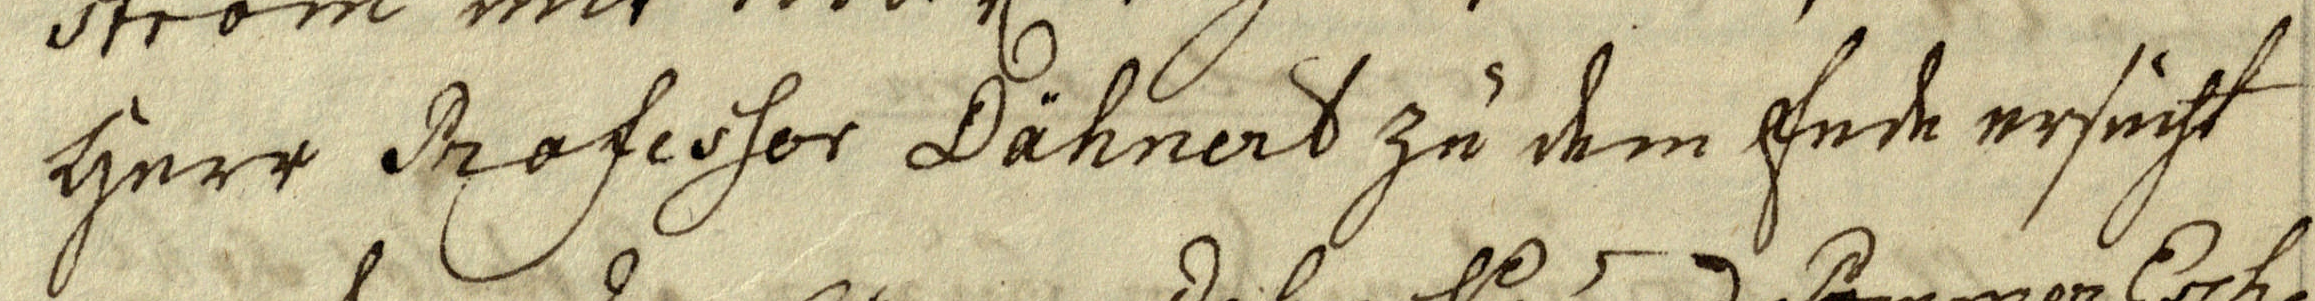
Herr Professor Dähnert zu dem Ende ersucht
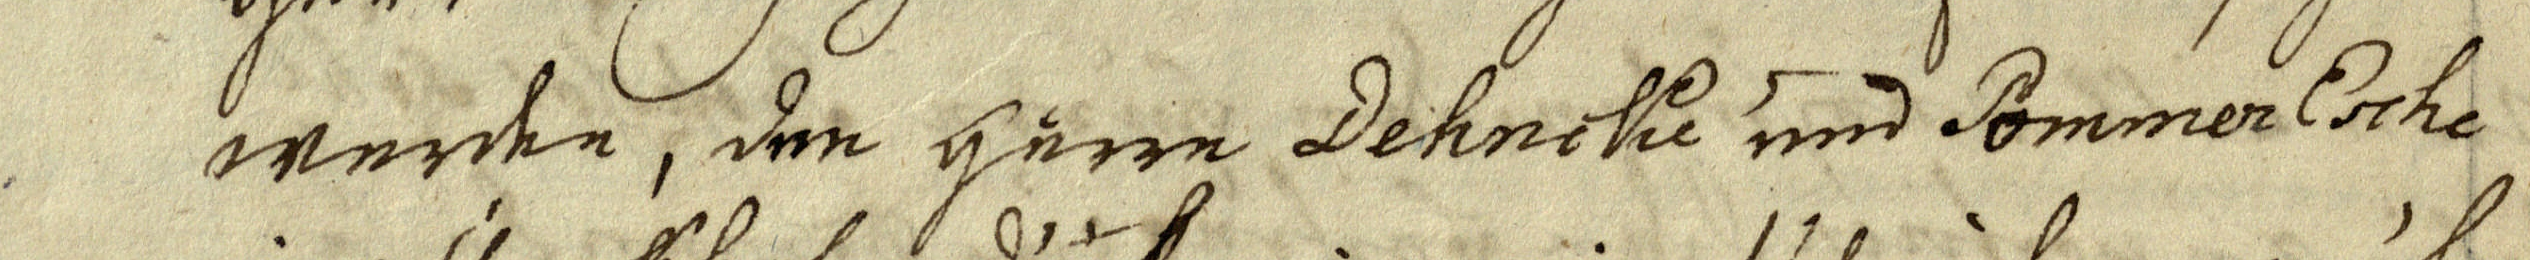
werden, den Herrn Dencke und PommerEsche
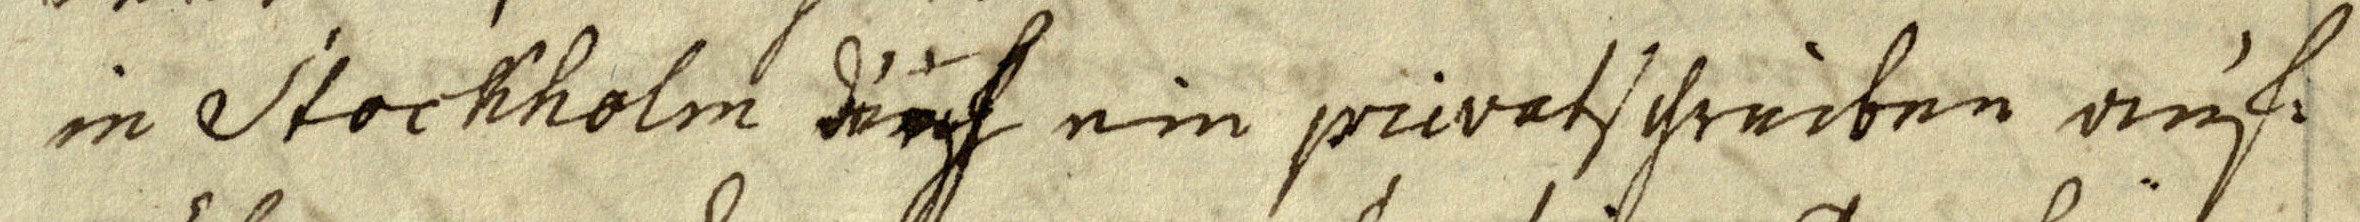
in Stockholm durch ein privatschreiben auf¬
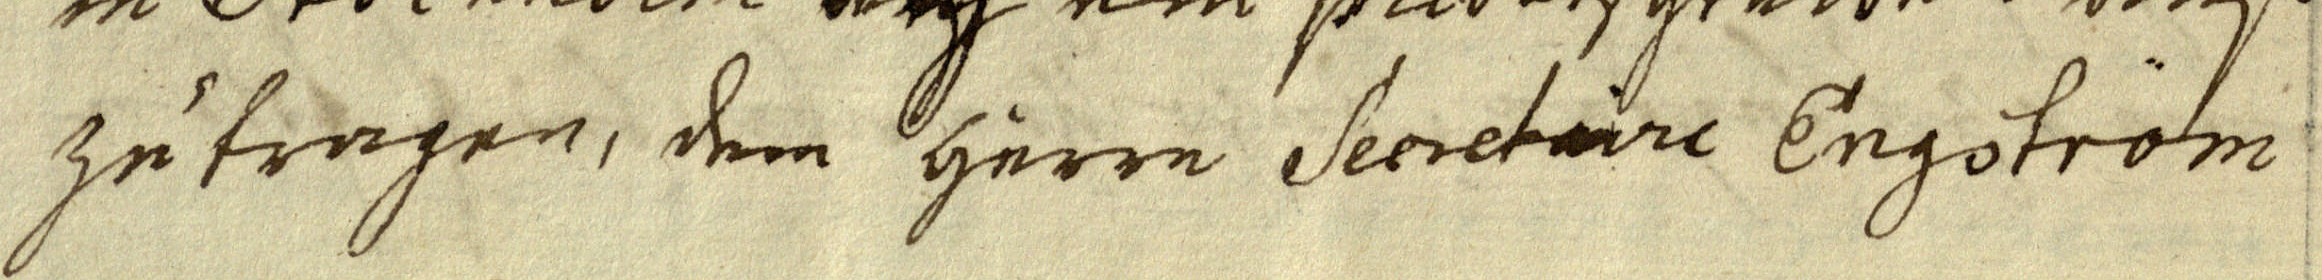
zu tragen dem Herrn Secretaire Engström
